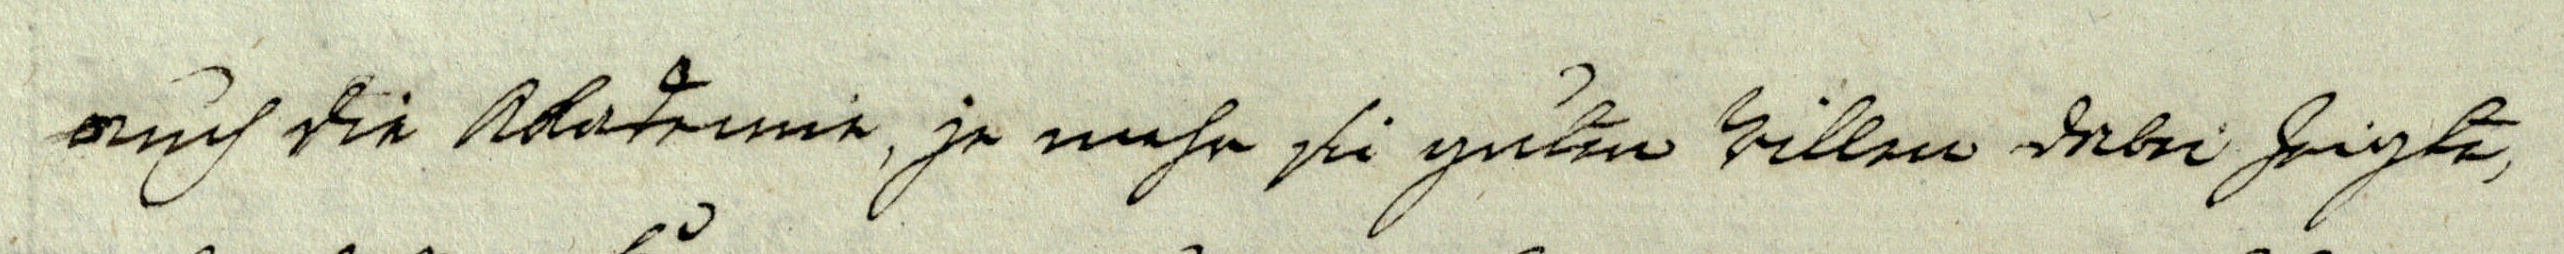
auch die Akademie, je mehr sie guten Willen dabei zeigte,
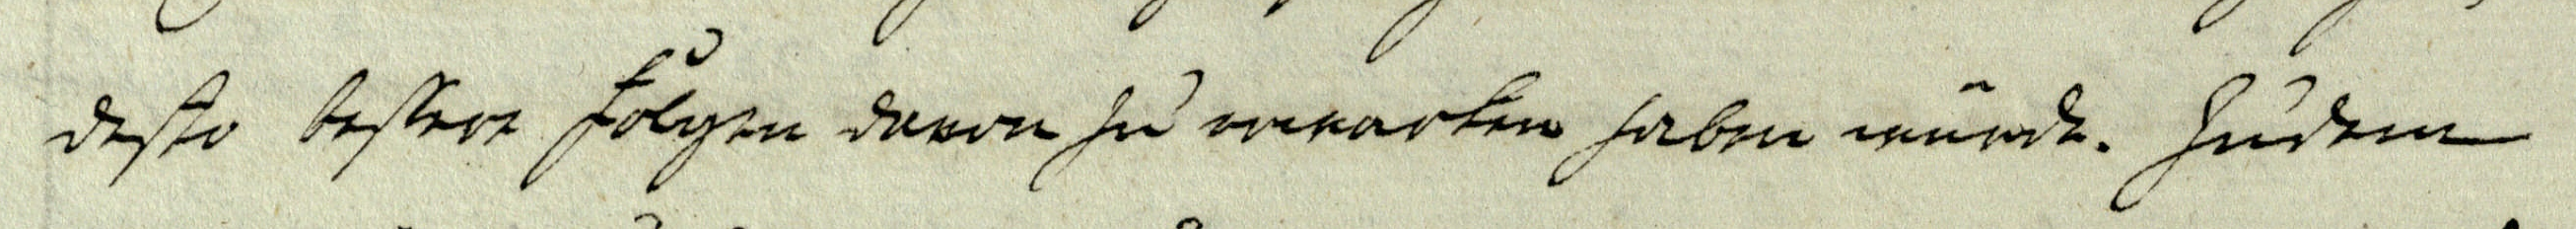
diesto bessere Folgen davon zu erwarten haben würde. Zudem
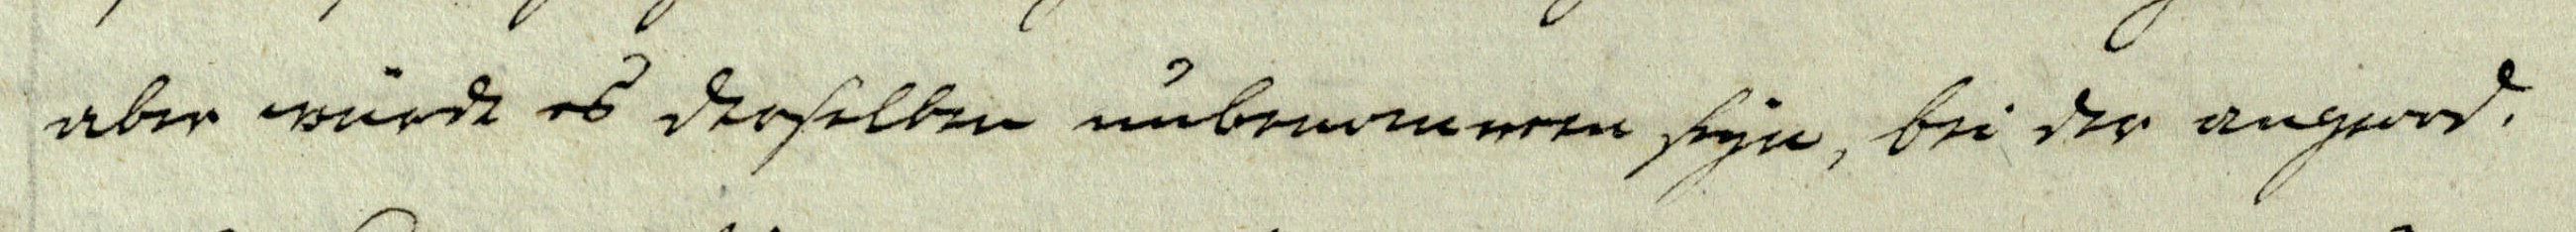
aber würde es derselben unbenommen seÿn, bei der angeord¬
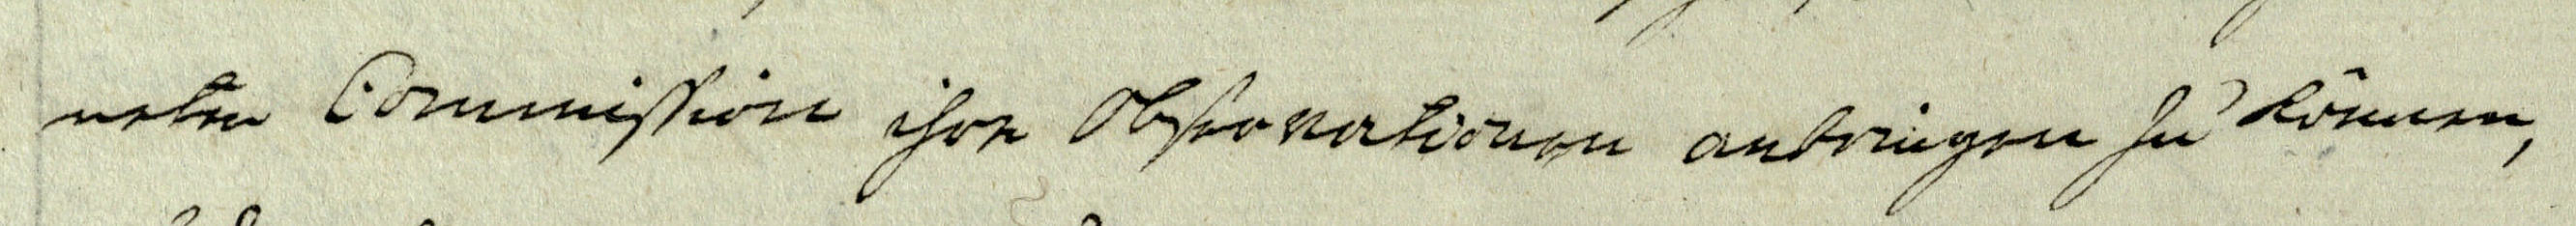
neten Commission ihre Observationen anbringen zu können,
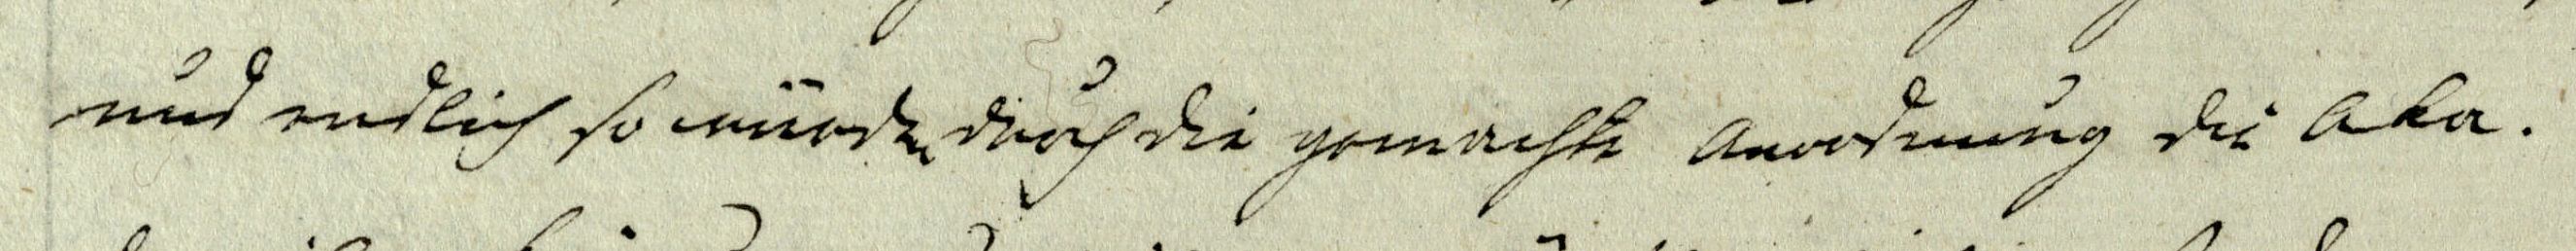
und endlich so würden durch die gemachte Anordnung die Aka¬
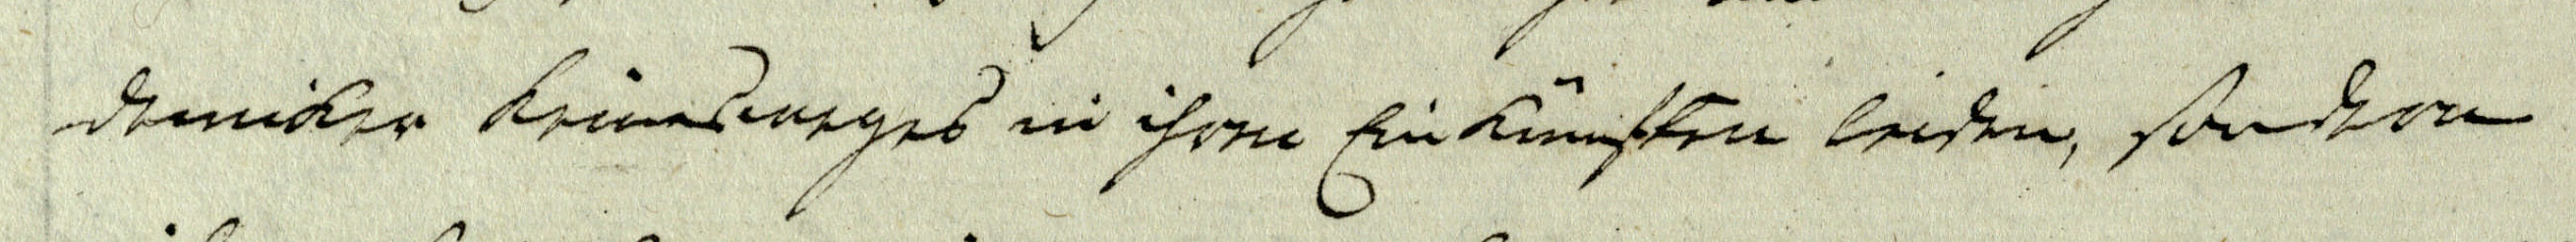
demiker keinesweges in ihren Einkünften leiden, sondern
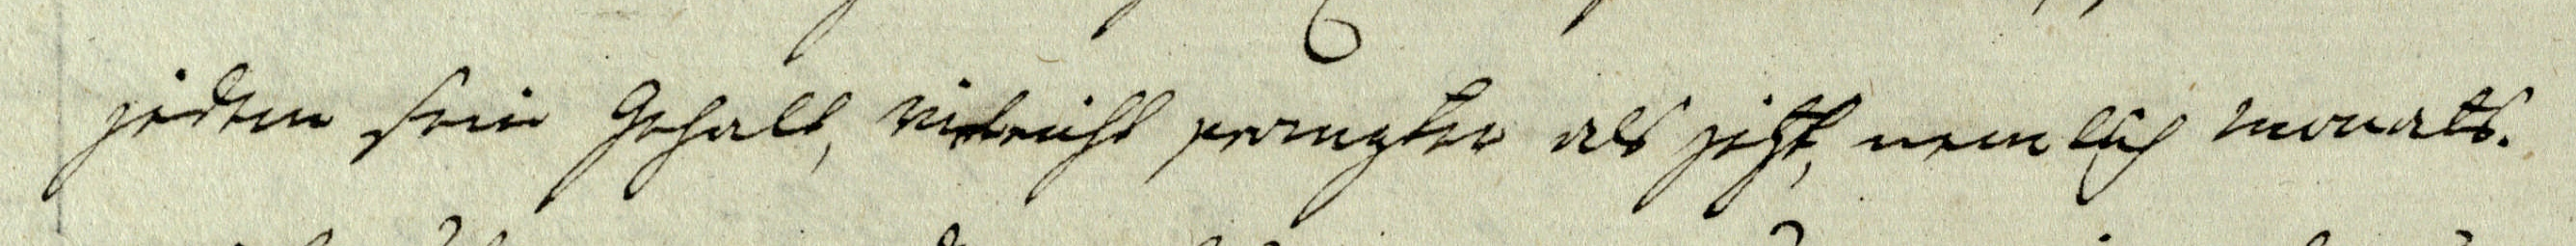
jedem sein Gehalt, vieleicht prompter als jetzt, nemlich Monats¬
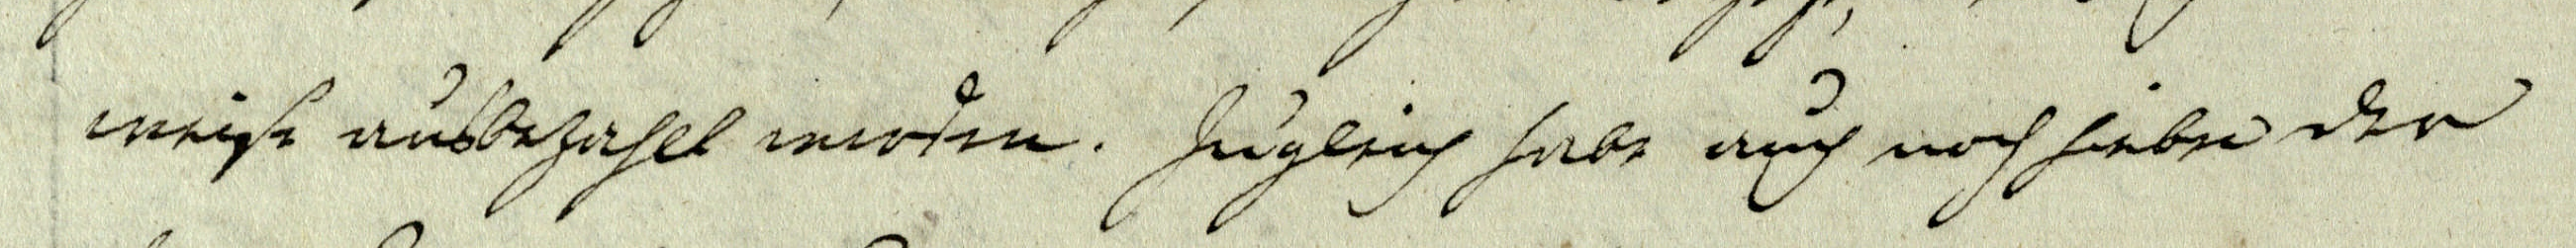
weise ausbezahlt werden. Zugleich habe auch noch hiebei der
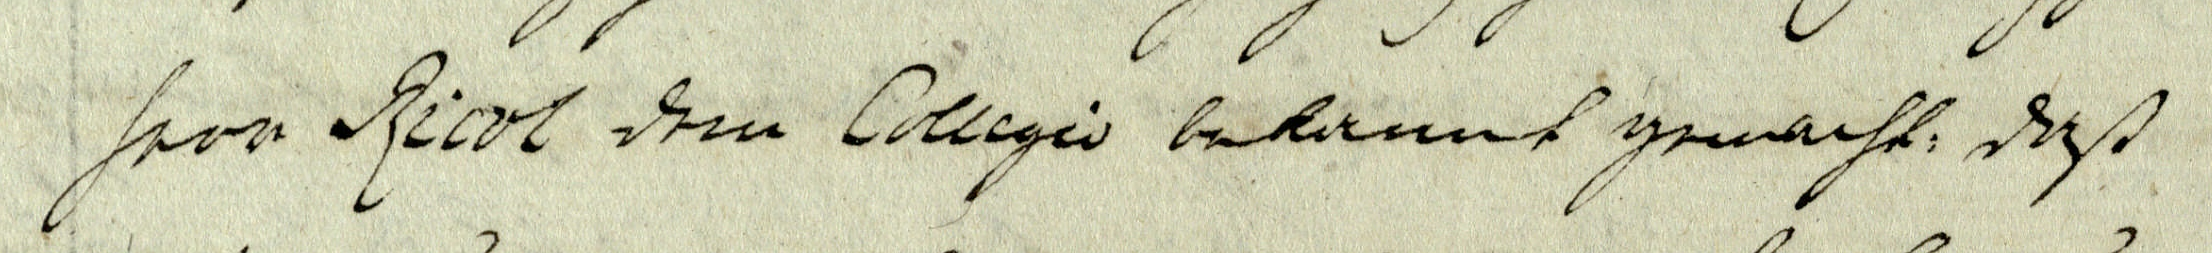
Herr Ricot dem Collegio bekannt gemacht, daß
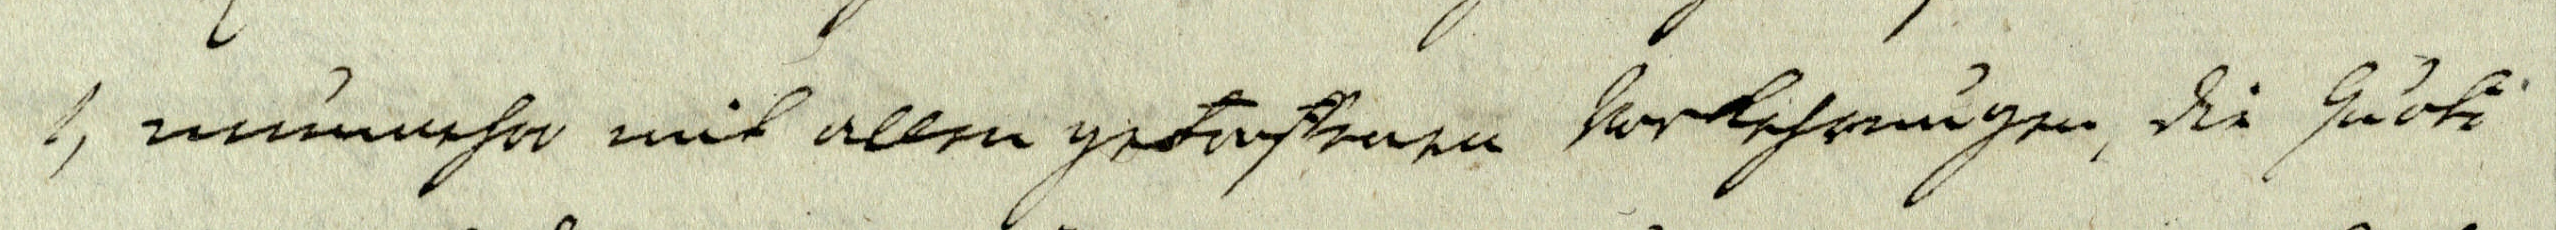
1, nunmehro mit allen getroffenen Vorkehrungen, die Quoti
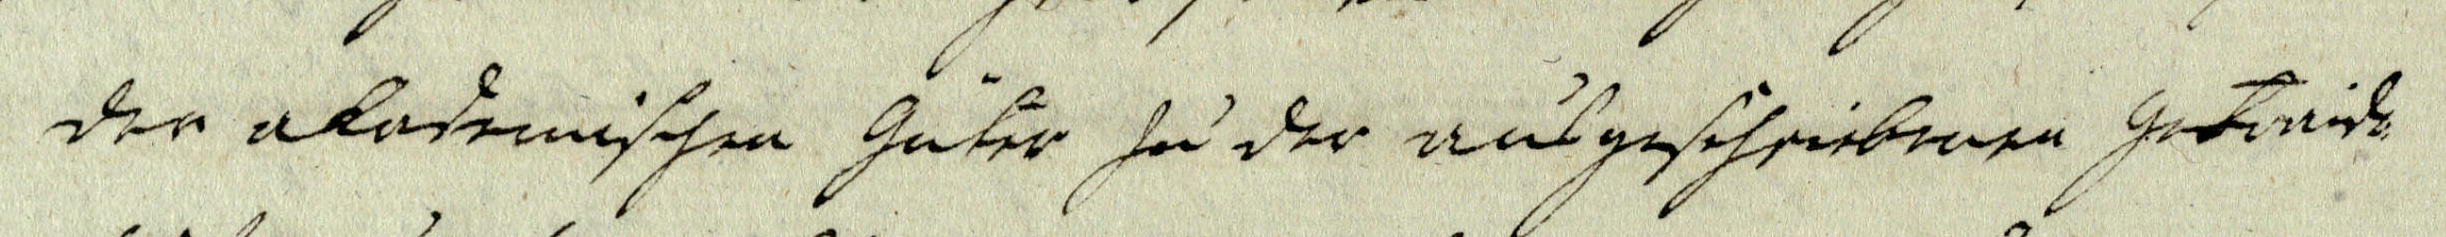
der akademischen Güter zu der ausgeschriebenen Getreide¬
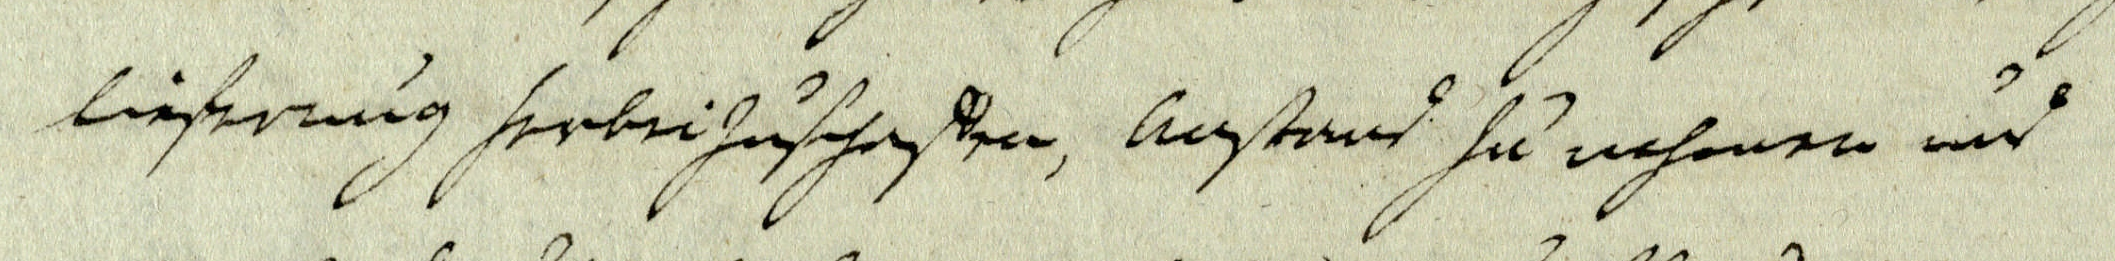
lieferung herbei zuschaffen, Anstand zu nehmen und
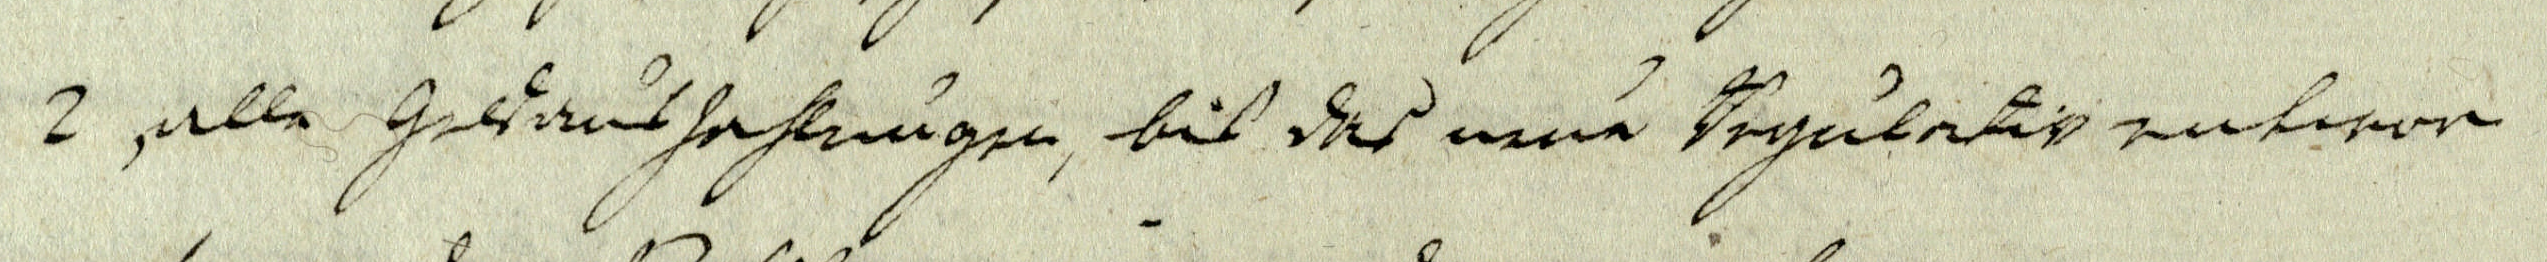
2, alle Geldauszahlungen, bis das neue Regulativ entwor¬
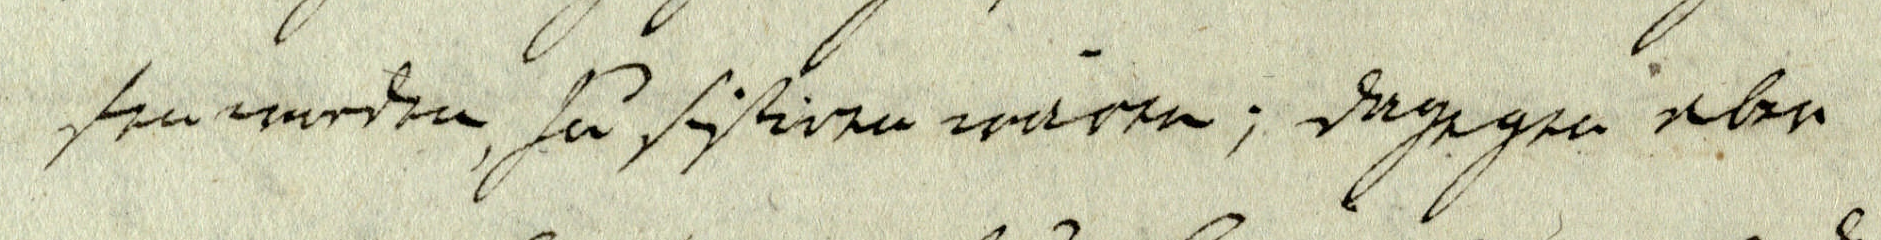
fen worden, zu sistiren wären; dagegen aber
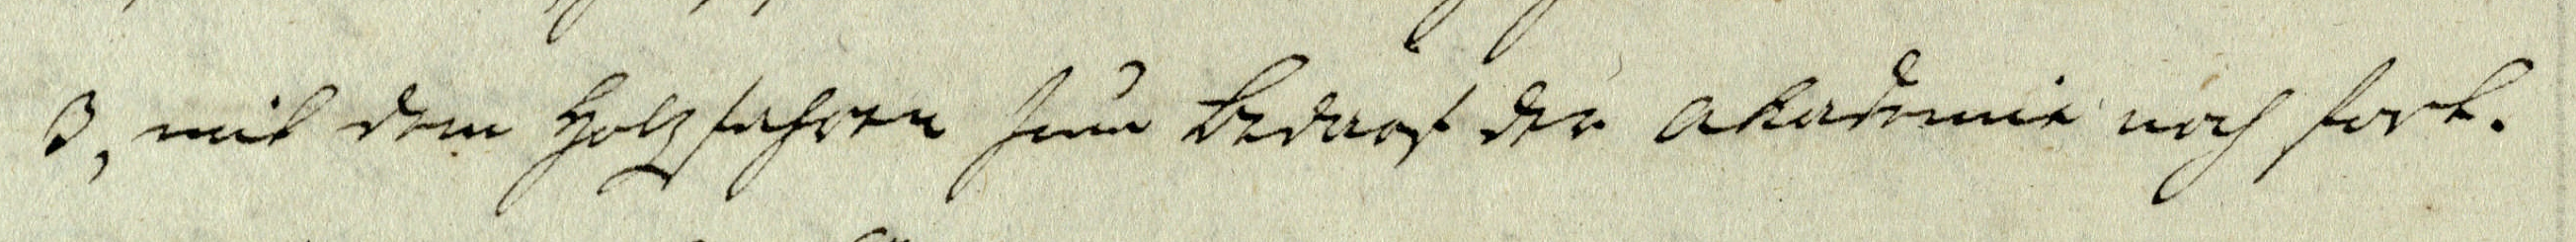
3, mit dem Holzfahren zum Bedarf der Akademie noch fort¬
